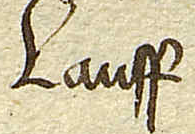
Lauff
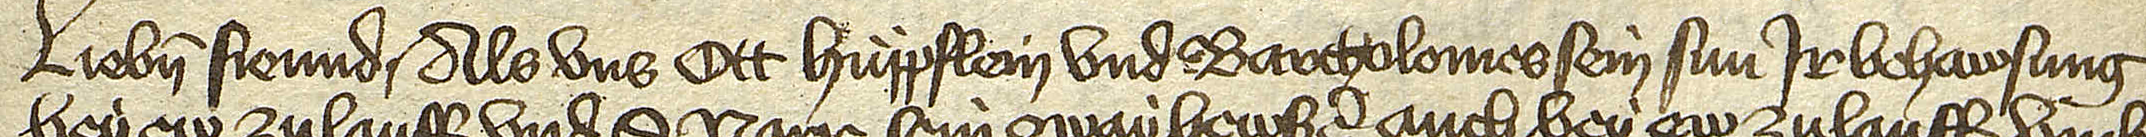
Liebn* freund / Als vns Ott hüppflein vnd Bartholomes ſein ſun Ir behawſung
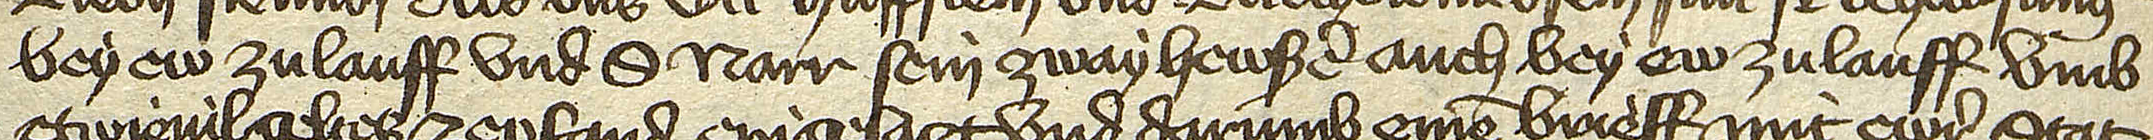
bey ew ʒulauff vnd S Narr ſein cʒway hewſʒe* auch bey ew ʒulauff vmb
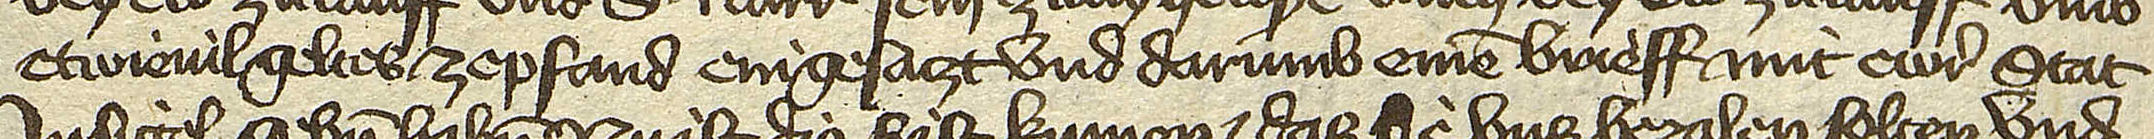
etwieuil geltes cʒepfand eingeſacʒt vnd darumb eine* brieff mit ewr* Stat
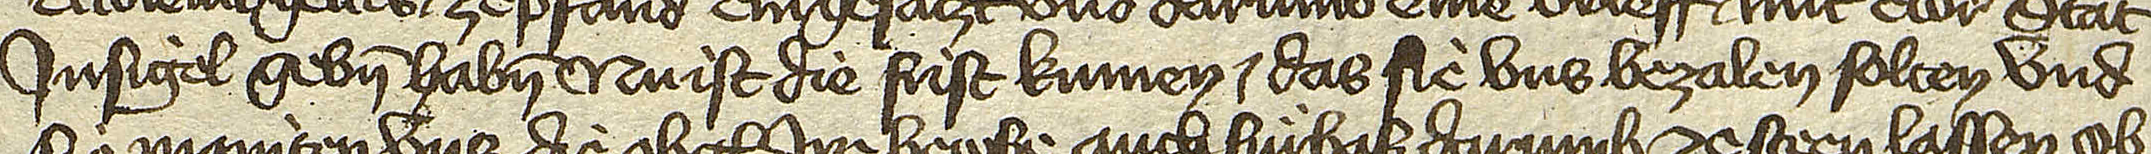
Inſigel gebn* habn* Nu iſt die friſt kumen / das ſie vns beʒalen ſolten vnd
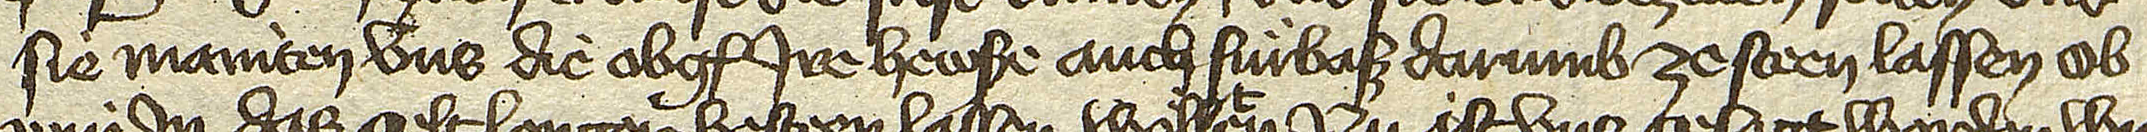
ſie mainten vns die obg* Ire hewſʒe auch fürbaſʒ darumb ʒeſteen laſſen Ob
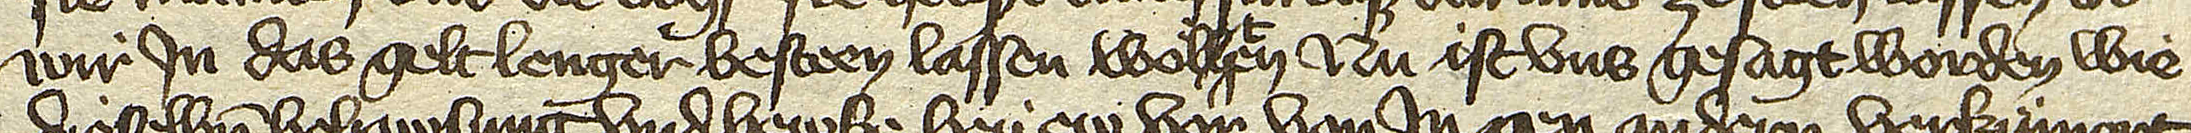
wir In das gelt lenger beſteen laſſen wöllen Nu iſt vns geſagt worden wie
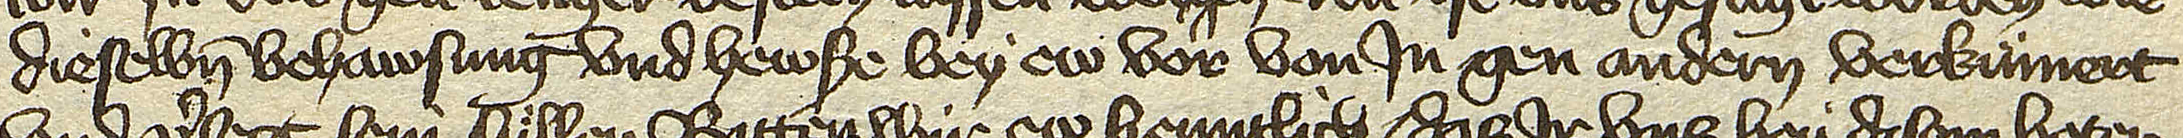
dieſelbn* behawſung vnd hewſʒe bey ew vor von In gen andern verkümert
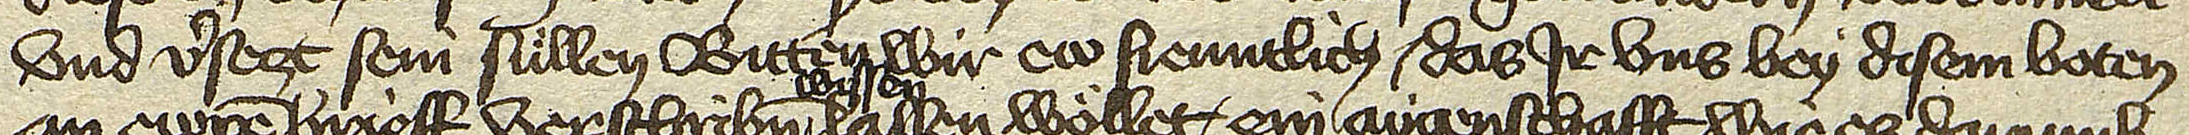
vnd v*ſecʒt ſein ſüllen Bitten wir ew freuntlich / das Ir vns diſem boten
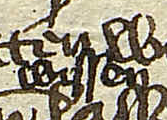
wiſſen
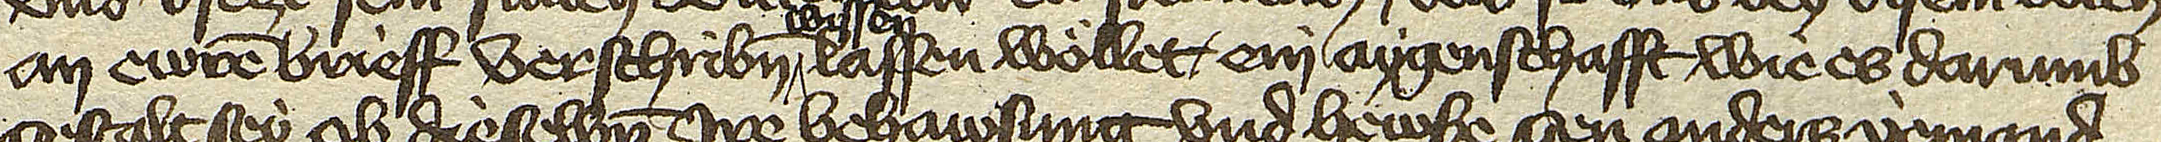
an ewre* brieff verſchribn laſſen wöllet / ein aygenſchafft / wie es darumb
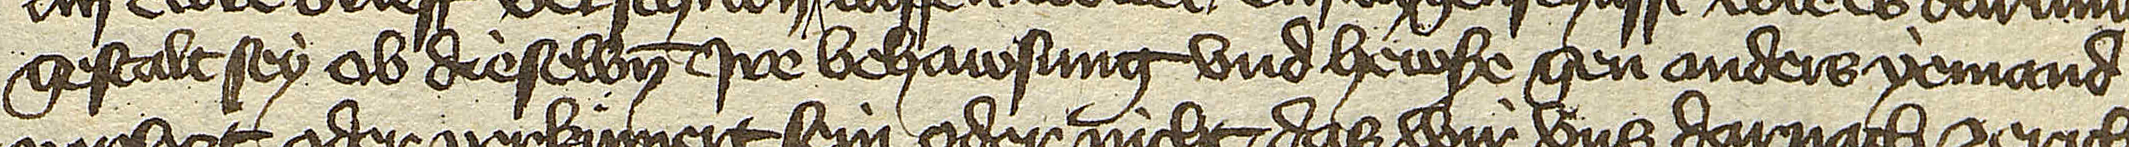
geſtalt ſey ob dieſelbn* Ire behawſung vnd hewſe gen anders yemand
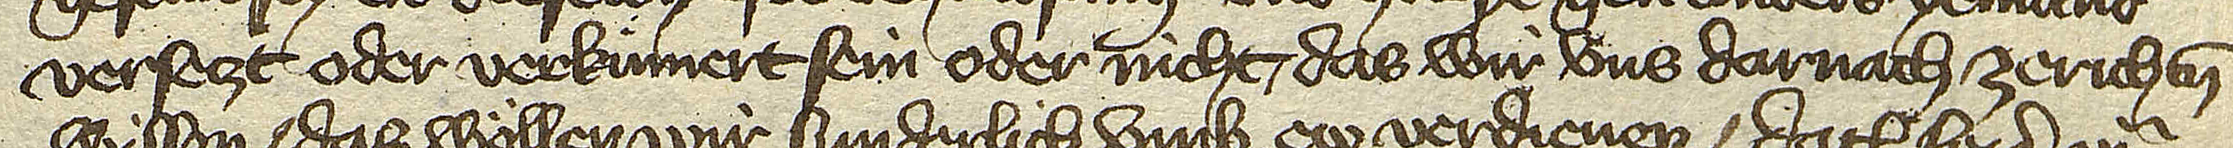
verſecʒt oder verkümert ſein oder nicht / das wir vns darnach cʒerichtn*
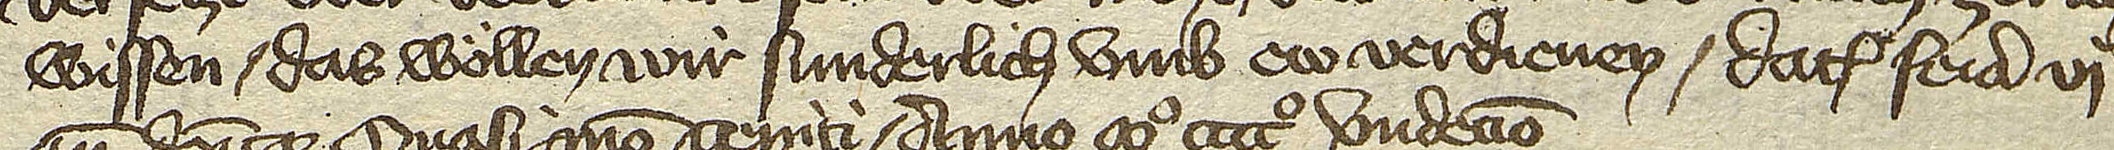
wiſſen / das wöllen wir ſunderlich vmb ew verdienen / dat* feia* vi*
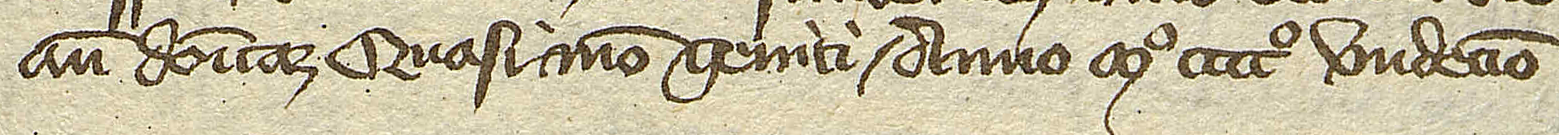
an* doica* Quaſimo* geniti / Anno M*cccc* vndecio*
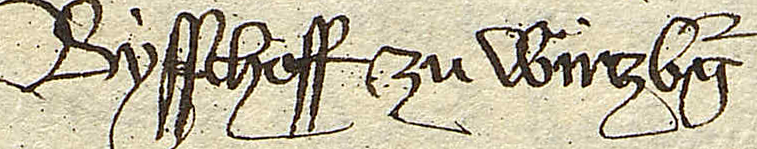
Byſſchoff cʒu Wircʒb*g
